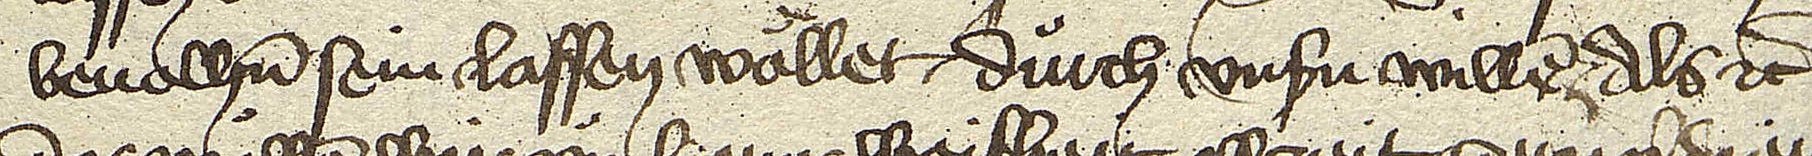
beuolhn* ſein / laſſen wöllet / dürch vnſ*n wille* / Als ec*
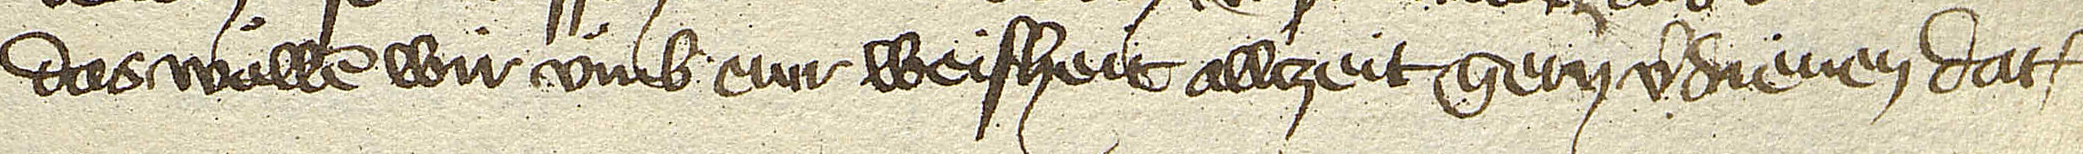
das wölle* wir v̈mb ewr weiſheit allcʒeit gern v*dienen dat*
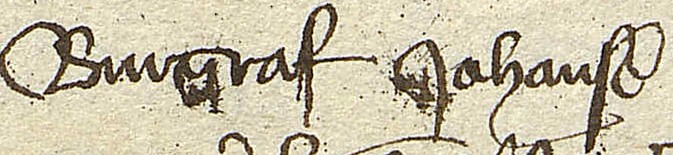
Burgraf Iohanſe*
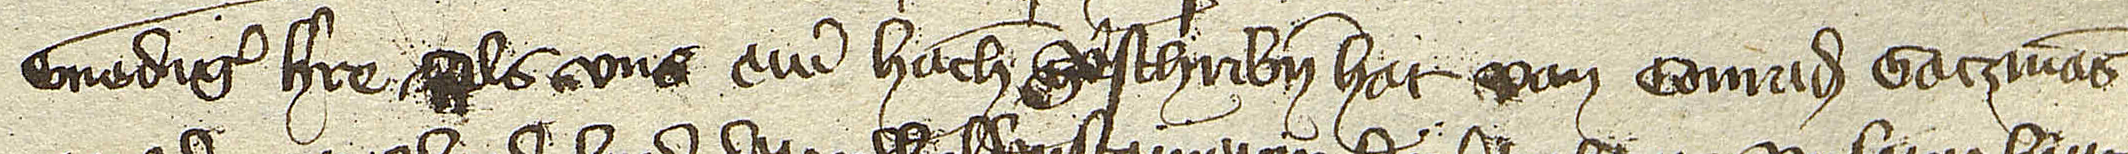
Gnedig* h*re / Als vns ew* hoch* geſchribn* hat von Conrad* Gocʒmas*
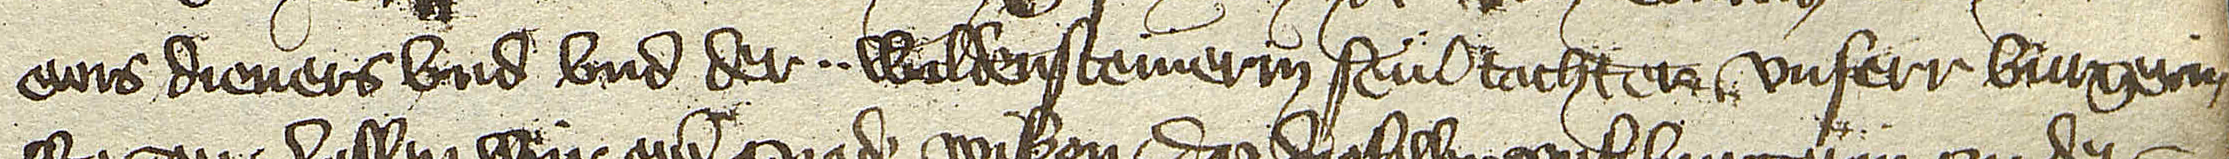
ewrs dieners vnd vnd der ~ waldenſteinerin ſeine* tochter vnſerr burgerin
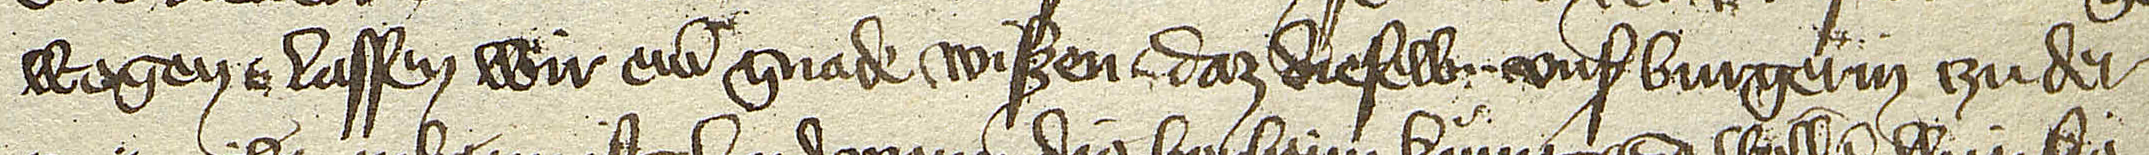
wegen ~ laſſen wir ew* gnade wiſʒen / daʒ dieſelb ~ vnſ* burgerin cʒu der
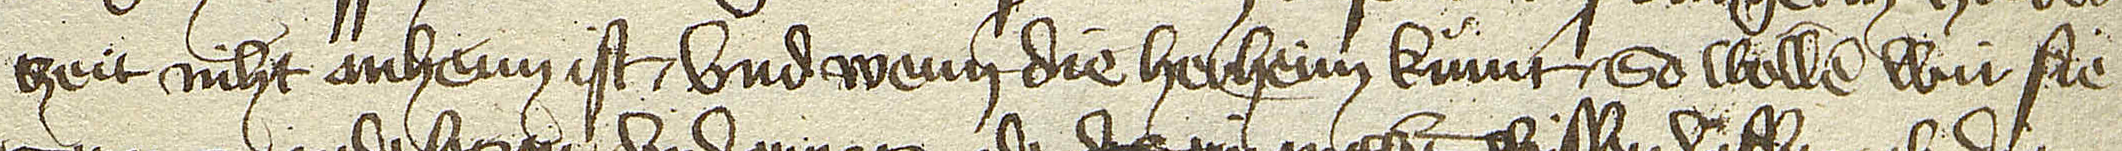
cʒeit niht anheim iſt / vnd wenn die herheim kümt / So wolle* wir ſie
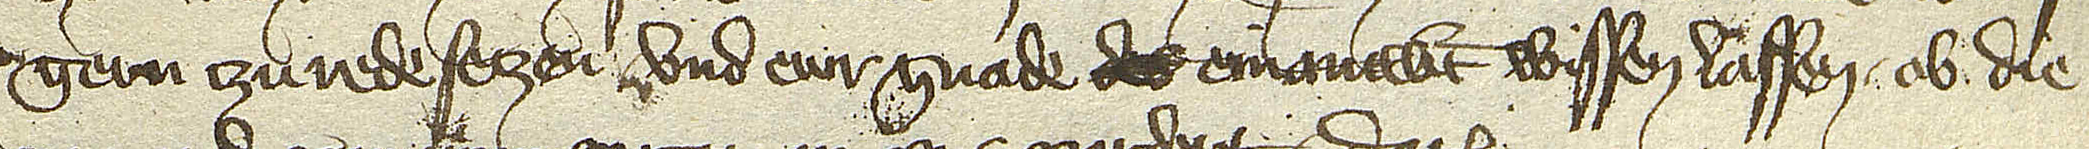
gern rede ſecʒen / vnd ewr gnade des ein antwt* wiſſen laſſen / ob die
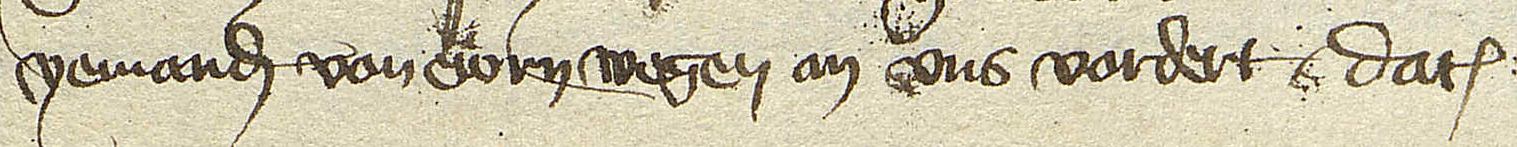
yemand* von ewrn wegen an vns vordert / dat*
